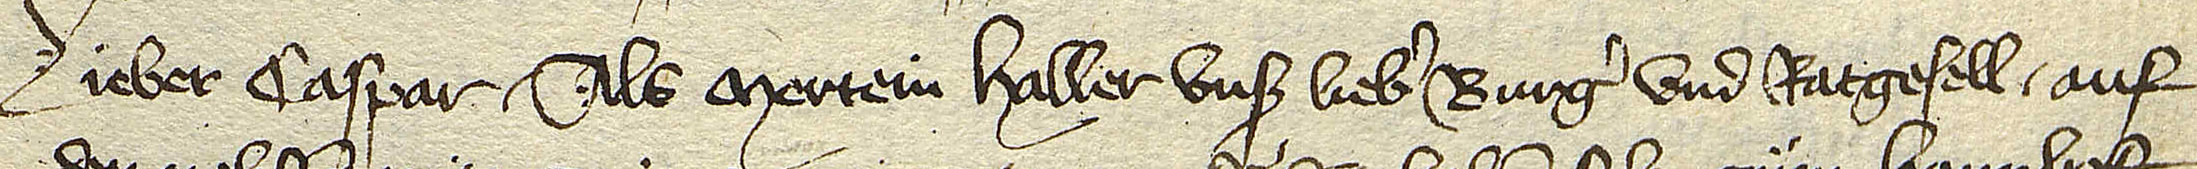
Lieber Caspar / Als Mertein haller vnſ* lieb* Burg* vnd Ratgeſell / auf
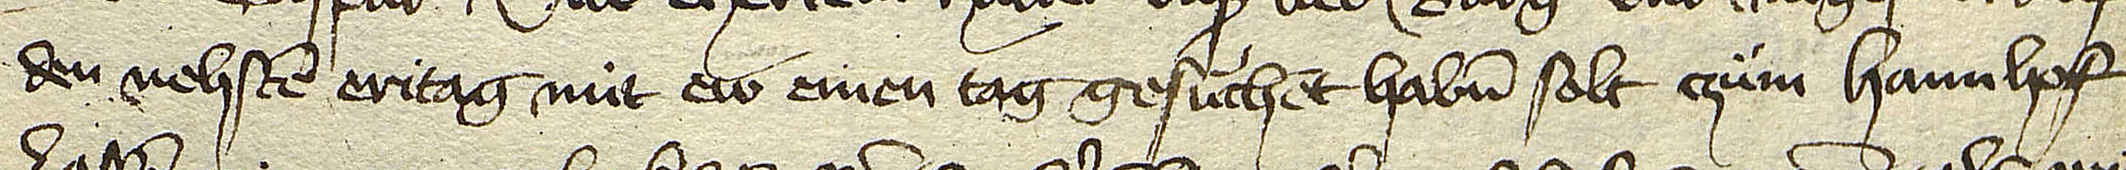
den nehſte* eritag mit ew einen tag geſüchet habn* ſolt cʒüm hannhof
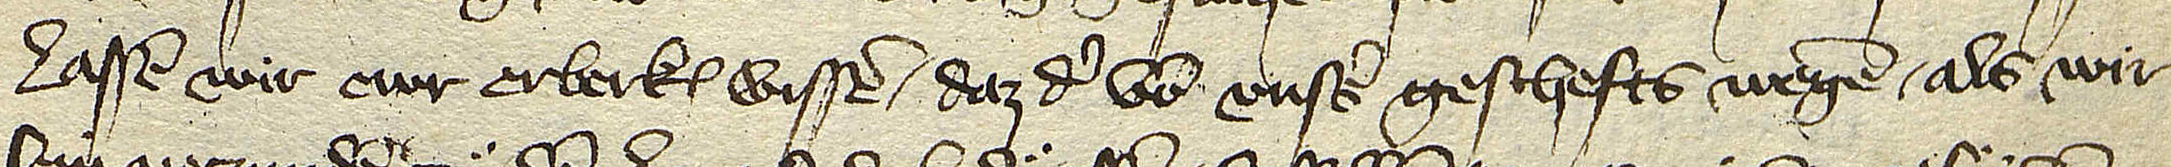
Laſſe* wir ewr erberk* wiſſe* / daʒ d* vo* vnſ*s geſchefts wege* / als wir
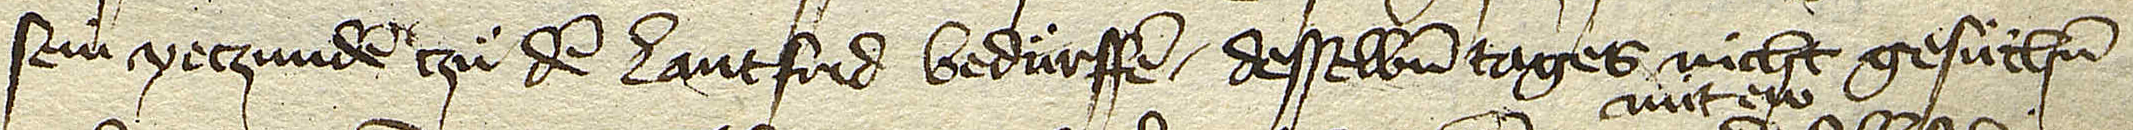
ſein yecʒund* cʒü d* Lantfrid bedürffe* / deſſelbn* tages nicht geſüchn*
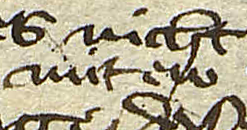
mit ew
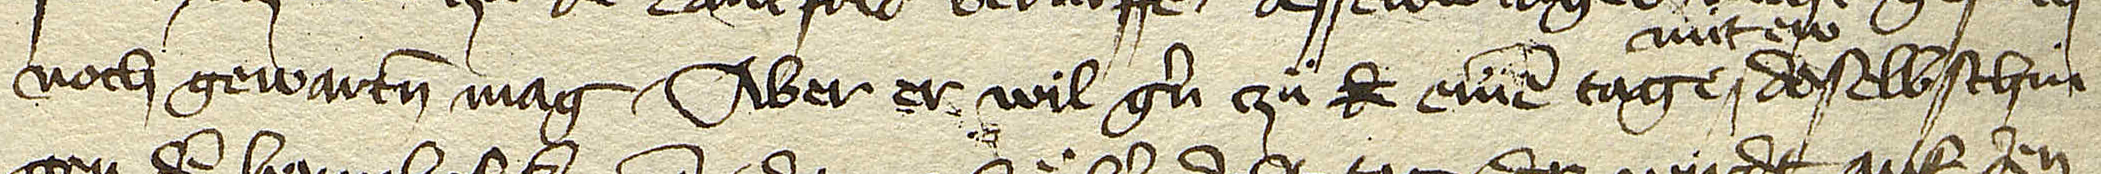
noch gewart*n mag / Aber er wil g*n cʒü d* eine* tage doſelbſthin
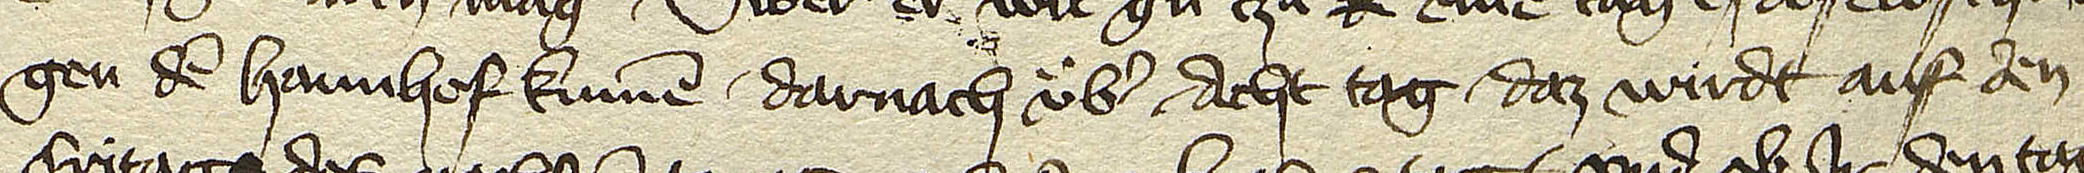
gen d* hannhof kume* / darnach v̈b* / Acht tag / daʒ wirdt auf den
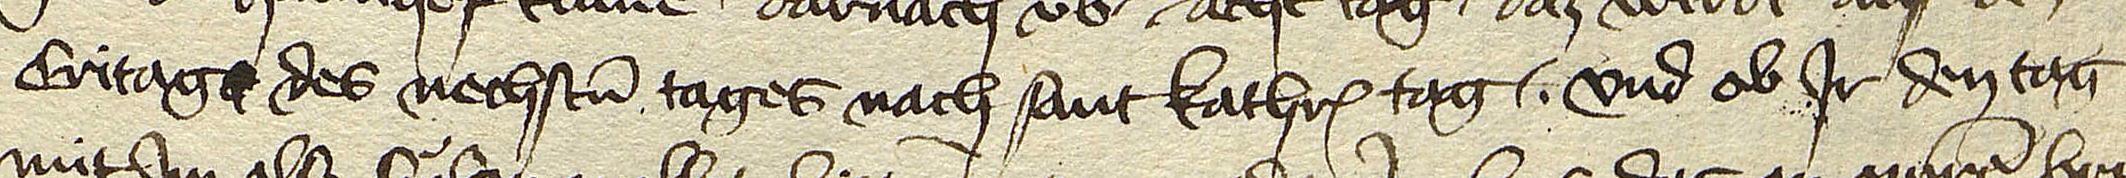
Eritag% des nechſtn* tages nach ſant kathr* tag / . vnd ob Ir den tag
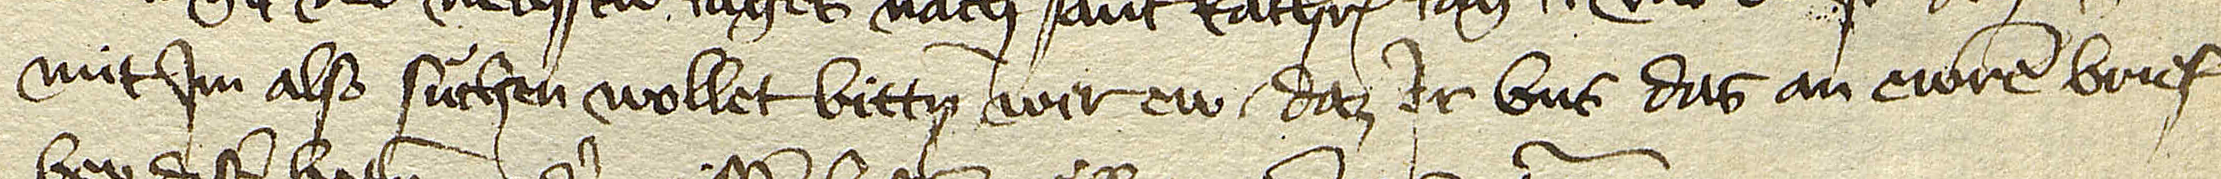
mit Im alſo ſüchen wollet bittn* wir ew / daʒ Ir vns das an ewre* brief
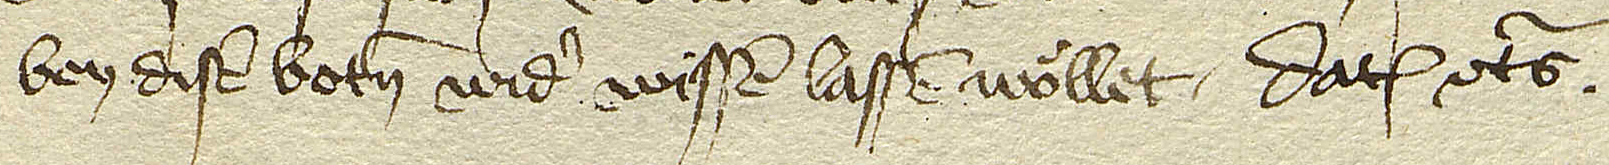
bey diſe* botn* wid* wiſſe* laſſe* wöllet / Dat* vts*.
